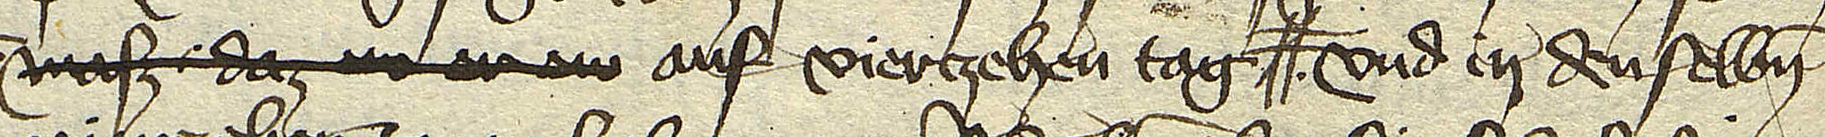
maſʒ / daʒ wo er ew auf viercʒehen tag / . vnd in den ſelbn*
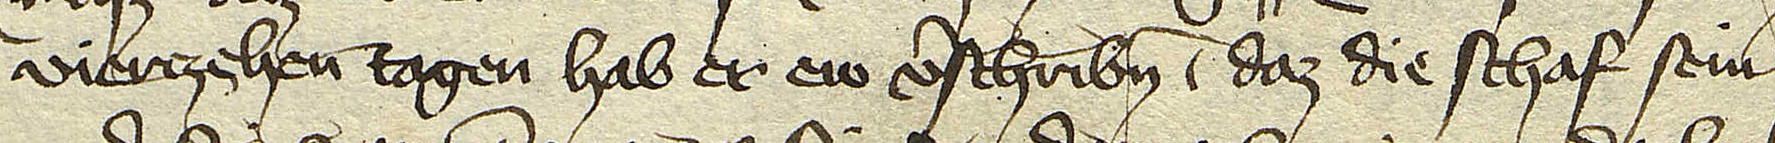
viercʒehen tagen hab er ew v*ſchribn* / daʒ die ſchaf ſein
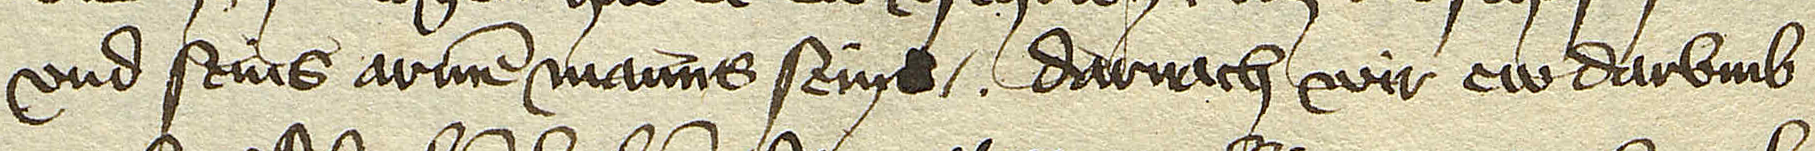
vnd ſeins arme* manns ſeins / . darnach wir ew darvmb
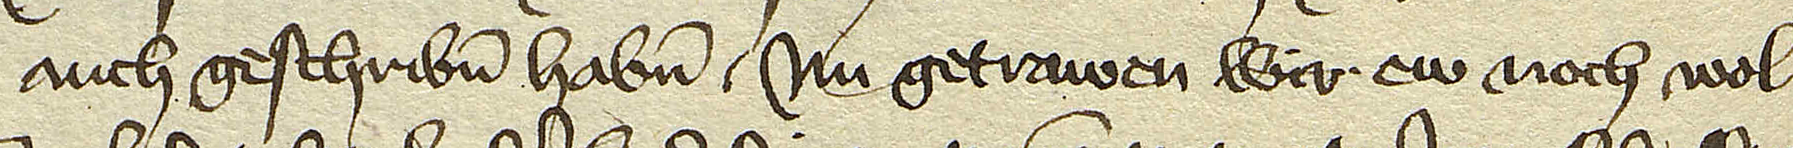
auch geſchribn* habn* / Nu getrawen wir ew noch wol
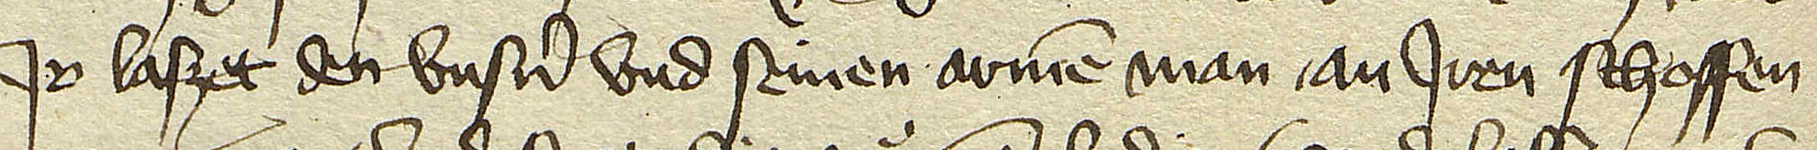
Ir laſʒet den vnſn* vnd ſeinen arme* man / an Iren ſchoffen
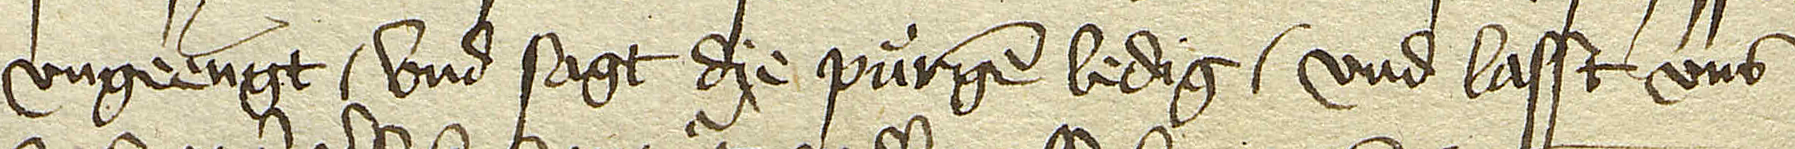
vngeengt / vnd ſagt die pürge* ledig / vnd laſſt vns
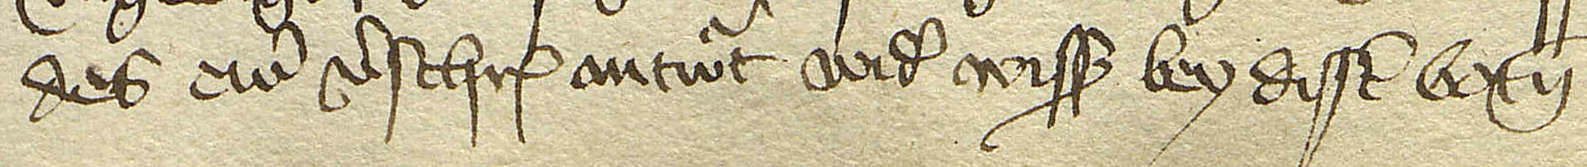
des ew* v*ſchr* antwt* wid* wiſſ* bey diſe* botn*
